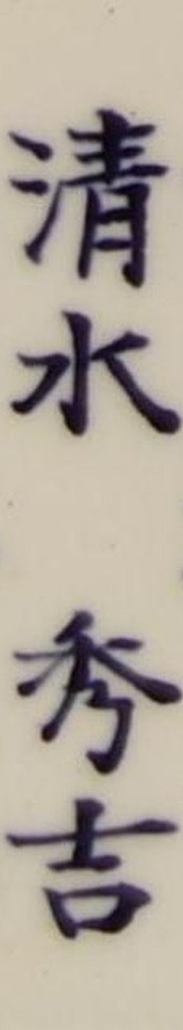清水秀吉
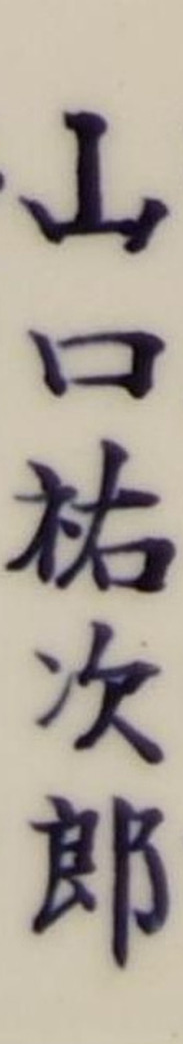山口祐次郎
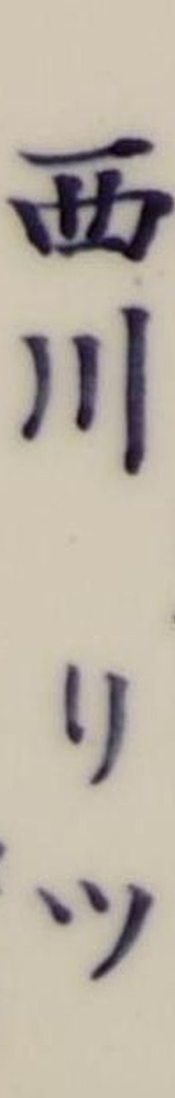西川リツ

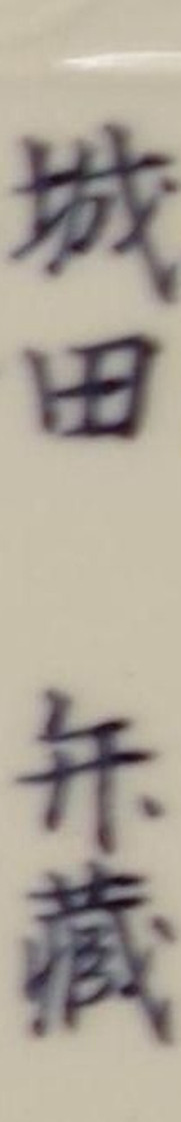城田弁蔵
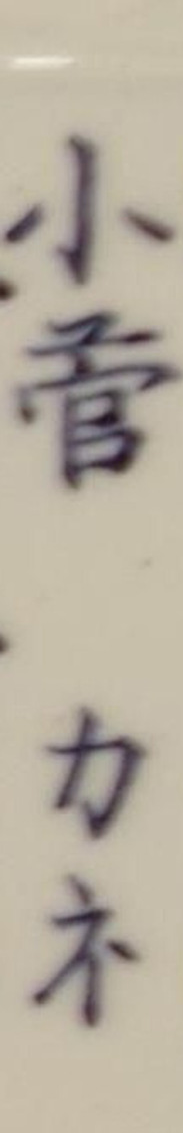小菅カネ
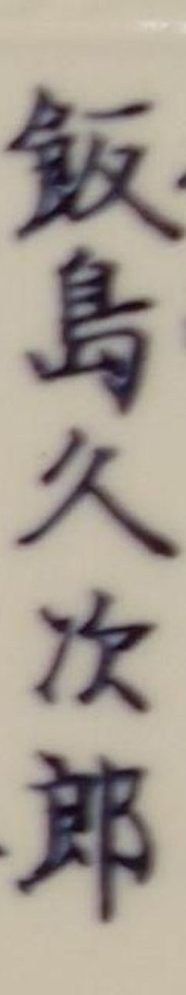飯島久次郎
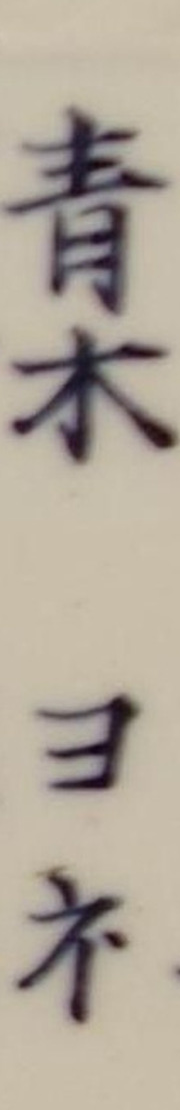青木ヨネ
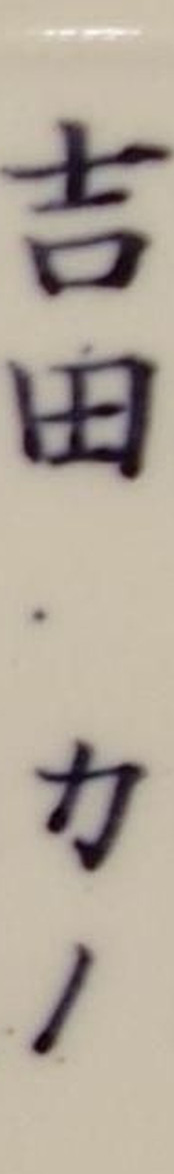吉田カノ
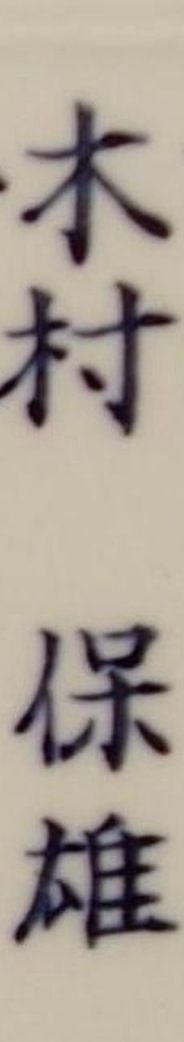木村保雄
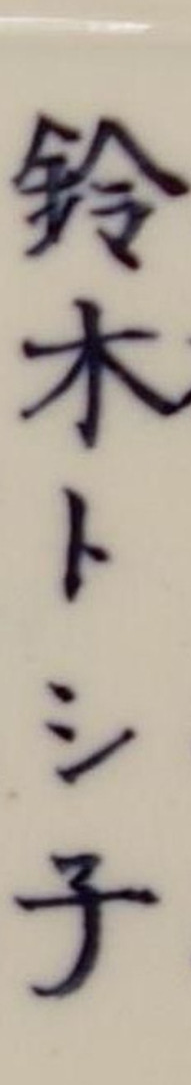鈴木トシ子
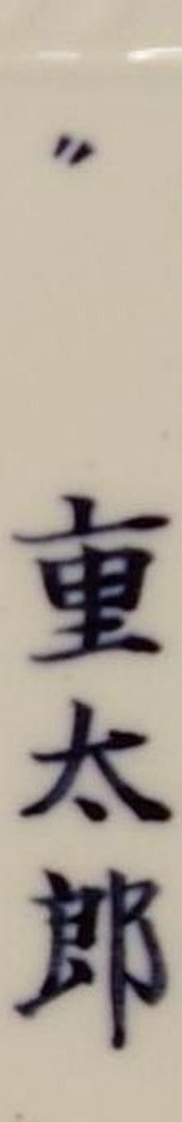重太郎
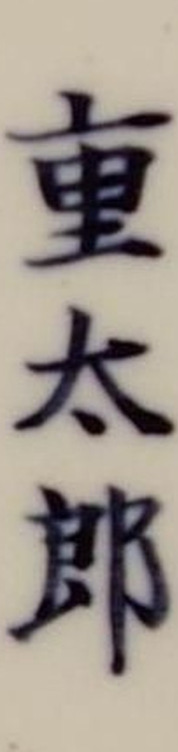重太郎
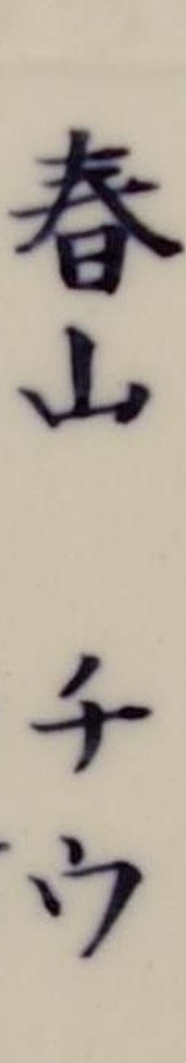春山チウ
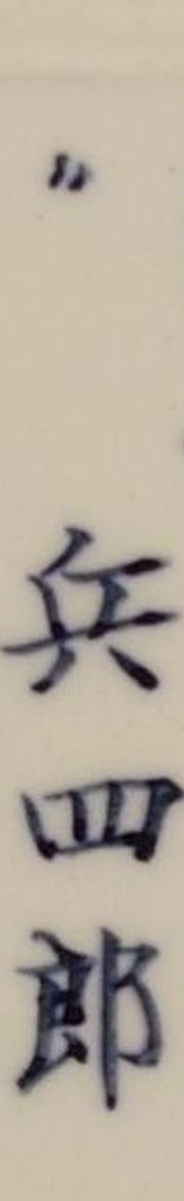兵四郎
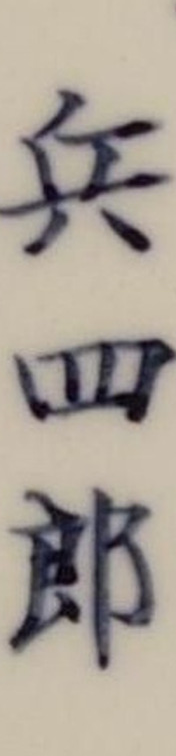兵四郎
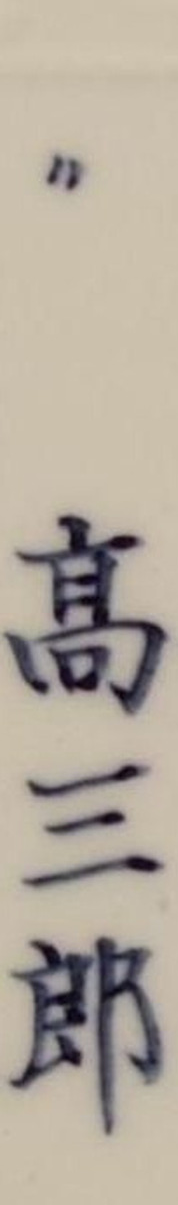高三郎
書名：M~S
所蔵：高野山金剛峯寺
